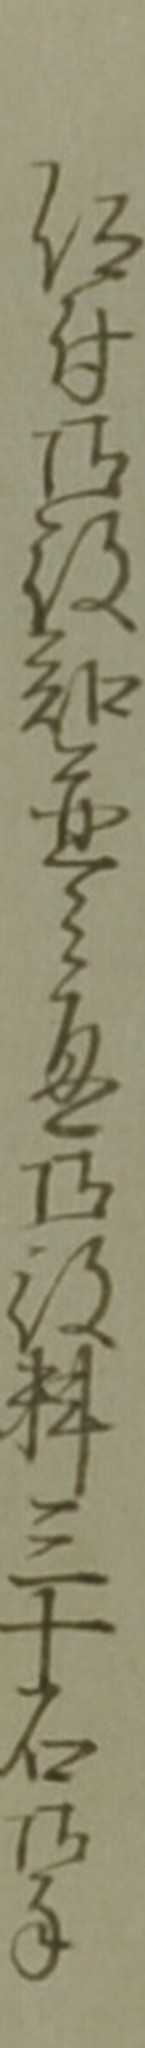仰付御役知並之通御役料三十石御手
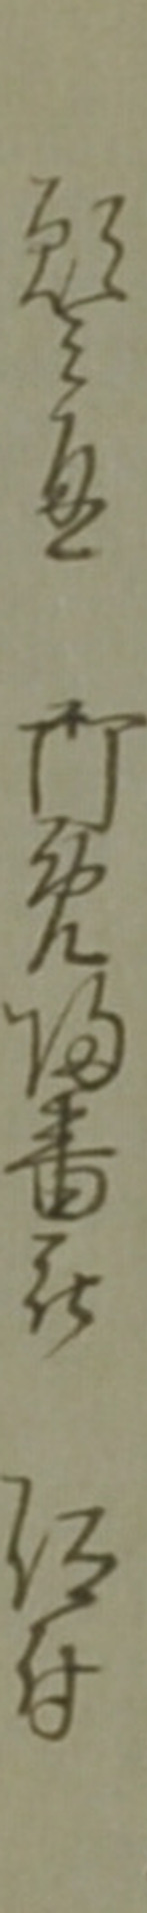願之通御免帰番被仰付
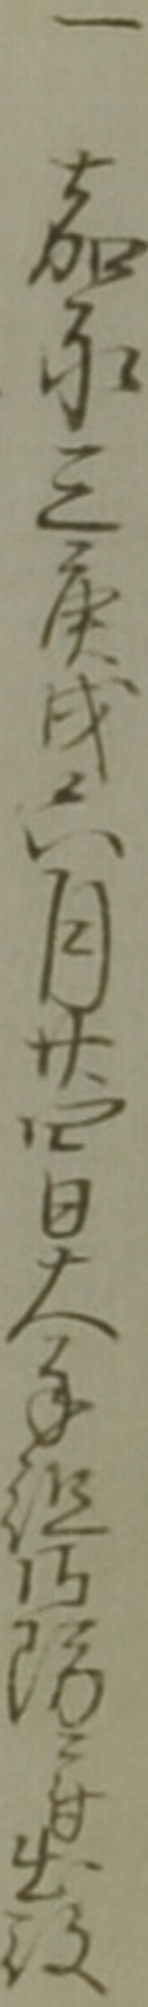一嘉永三庚戌六月廿四日大手組御防ニ付出役
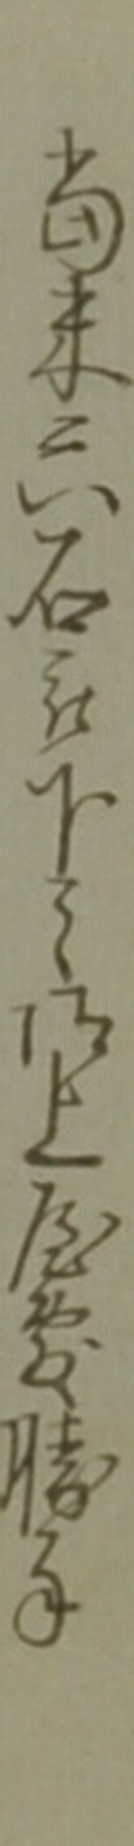当米六石被下之御上屋敷勝手
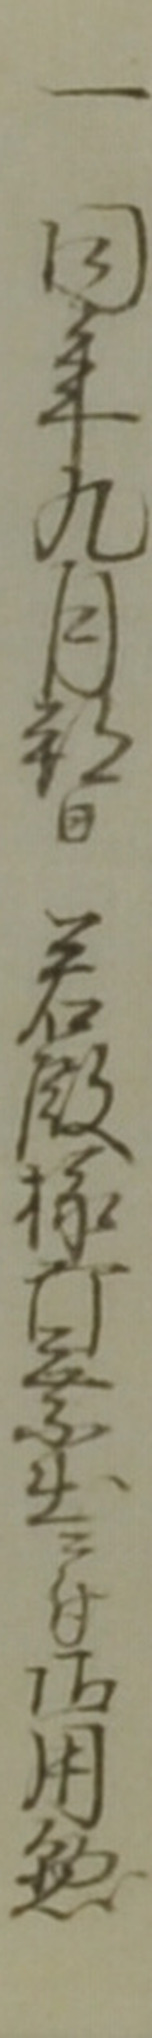一同年九月朔日若殿様御乗出ニ付御用懸
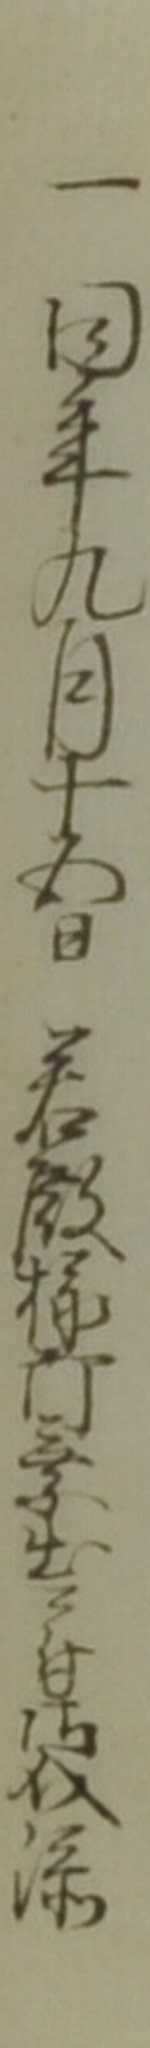一同年九月十五日若殿様御乗出ニ付御介添
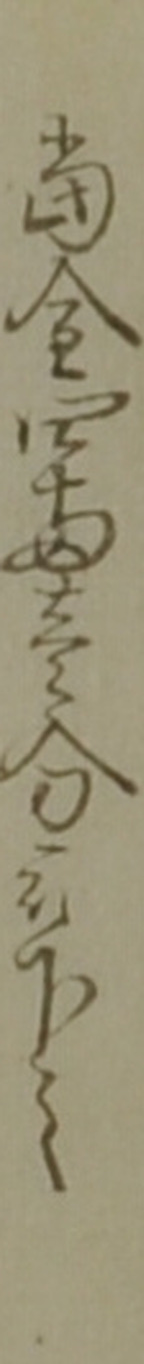当金四両壱分被下之
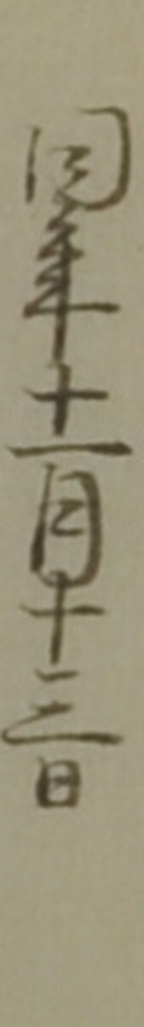一同年十一月十三日
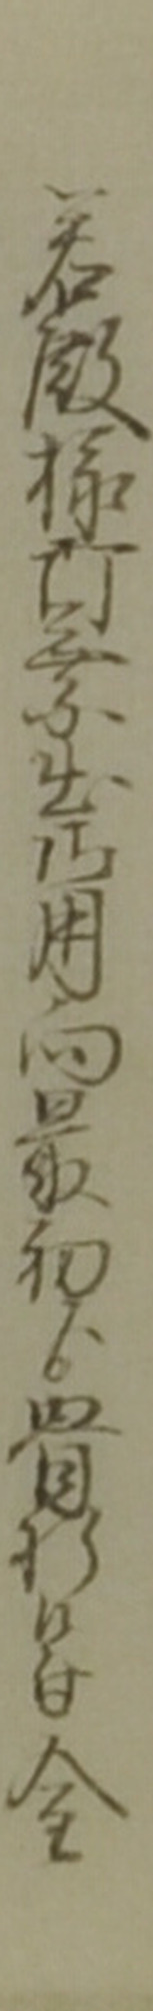若殿様御乗出御用向最初ゟ骨折候付金
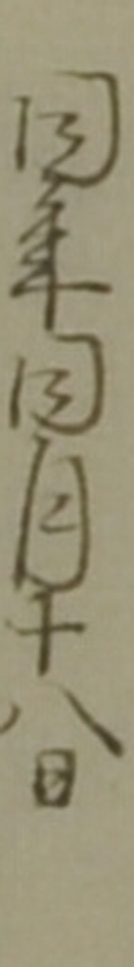一同年同月十八日
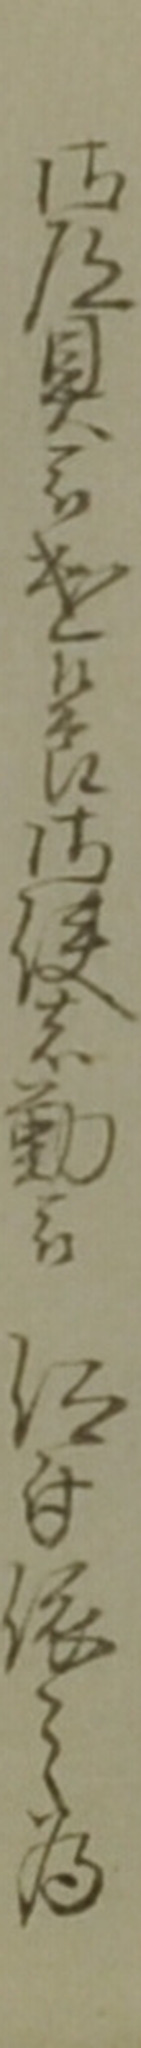御道具被遣候節御使者勤被仰付依之為
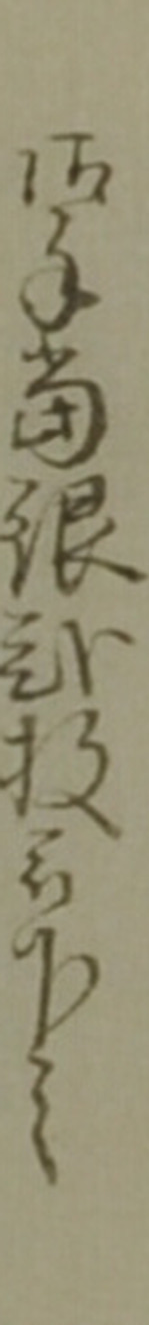御手当銀弐枚被下之
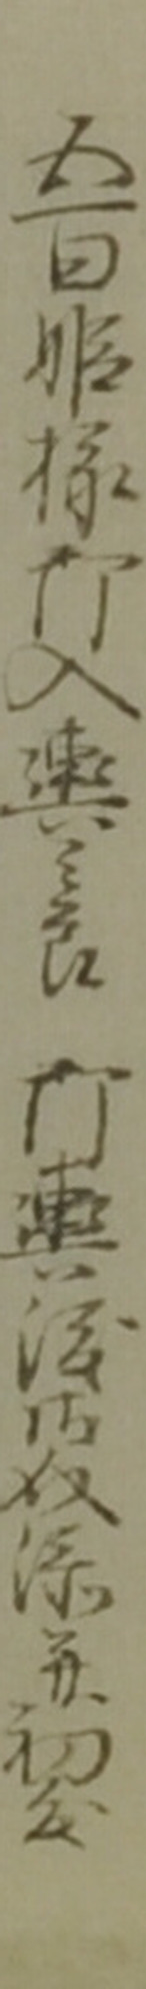五百姫様御入輿之節御輿渡御介添幷初度
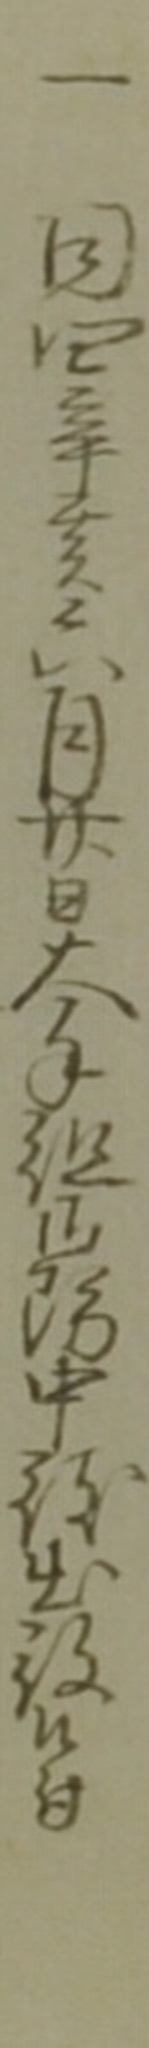一同四辛亥六月廿日大手組御防中致出役候付
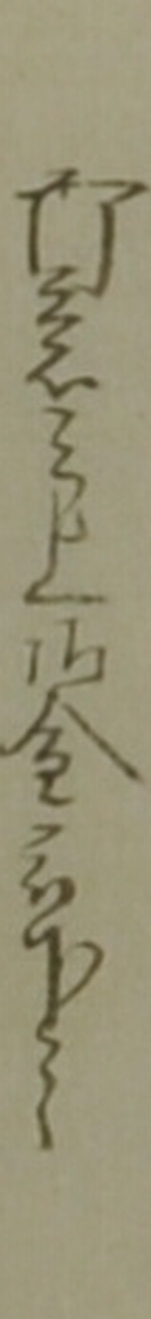御意之上御金被下之
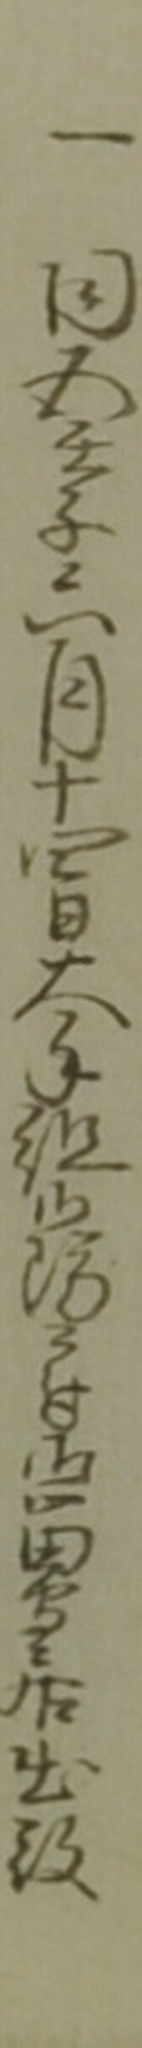一同五壬子六月十四日大手組御防ニ付御留守居出役
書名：給人諸士勤仕録（三）
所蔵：伊那市立高遠町図書館・合同会社AMANE
